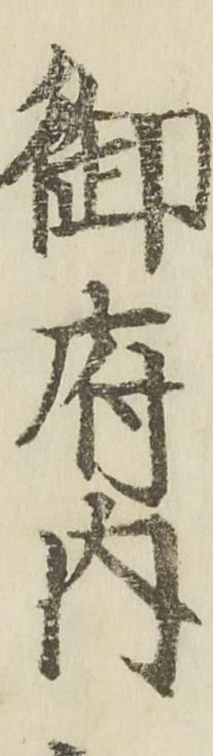御府内
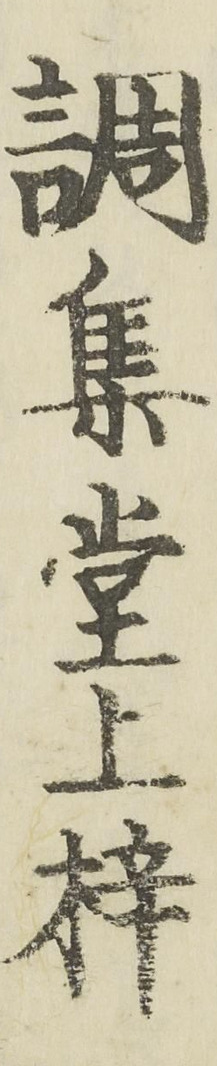調集堂上梓

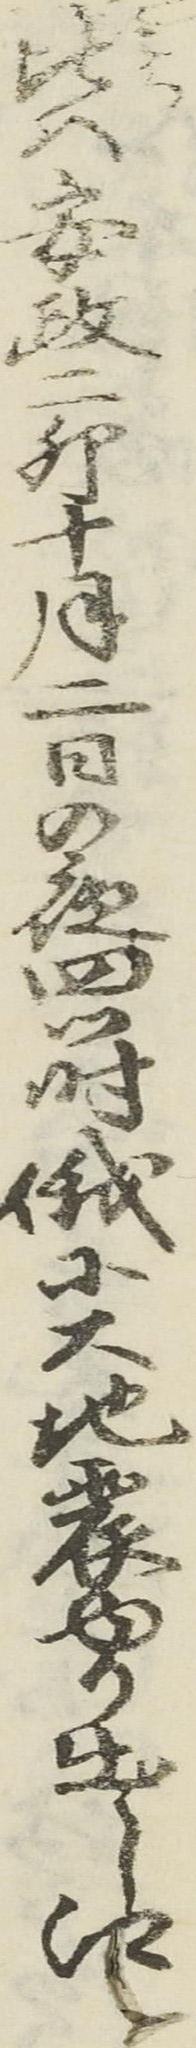比ハ安政ニ卯十月二日の夜四ツ時俄に大地震ゆり出し江
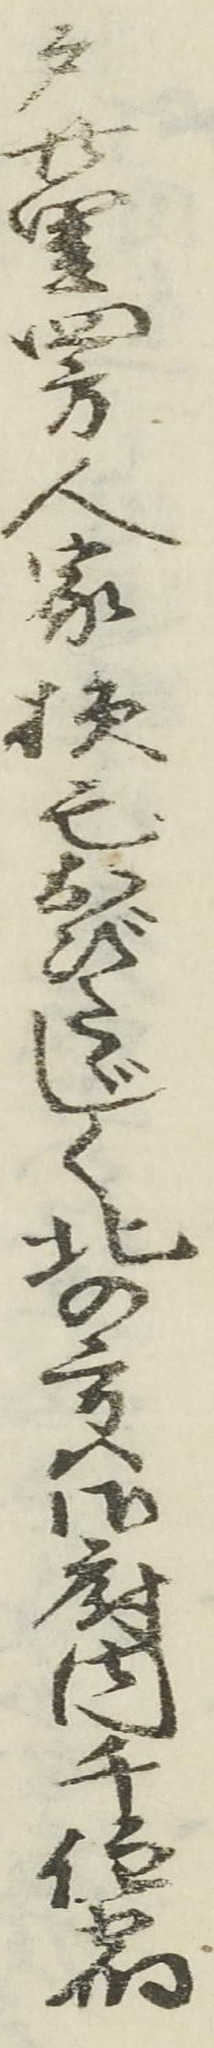戸廿里四方人家損亡おびたゞしく北の方は御府内千住宿
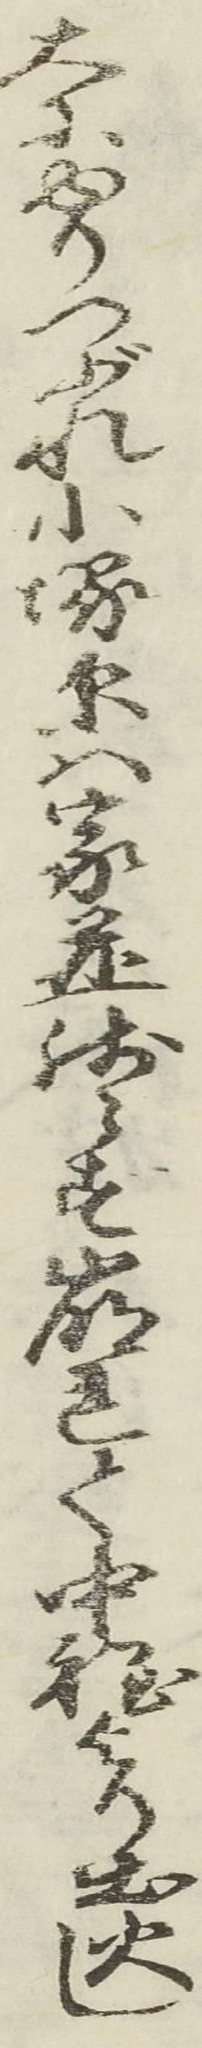大にゆりつぶれ小塚原は家並残らす崩れて中程より出火し
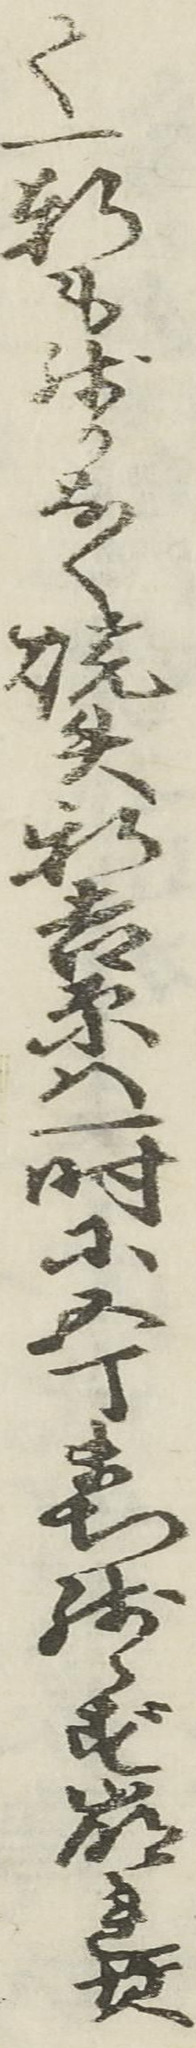て一軒も残りなく焼失新吉原は一時に五丁まち残らず崩れ其
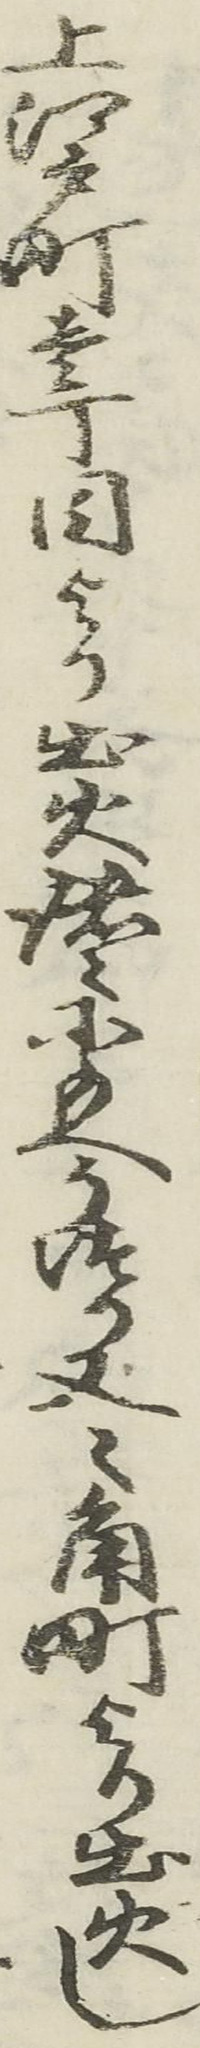上江戸町壱丁目より出火諸〻にもへうつり又〻角町より出火し
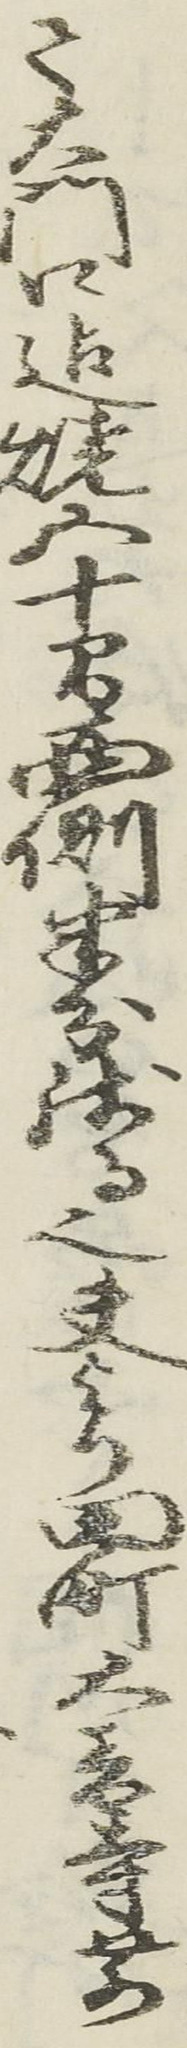て大門口迄焼五十間西側半分残る也夫より田町大善寺前
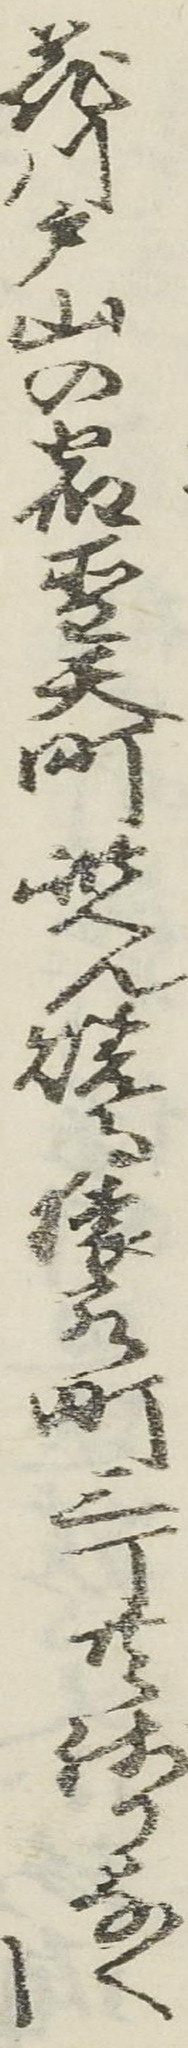浅草雷門花川戸山の宿聖天町此へん焼る猿若町三丁共残りなく
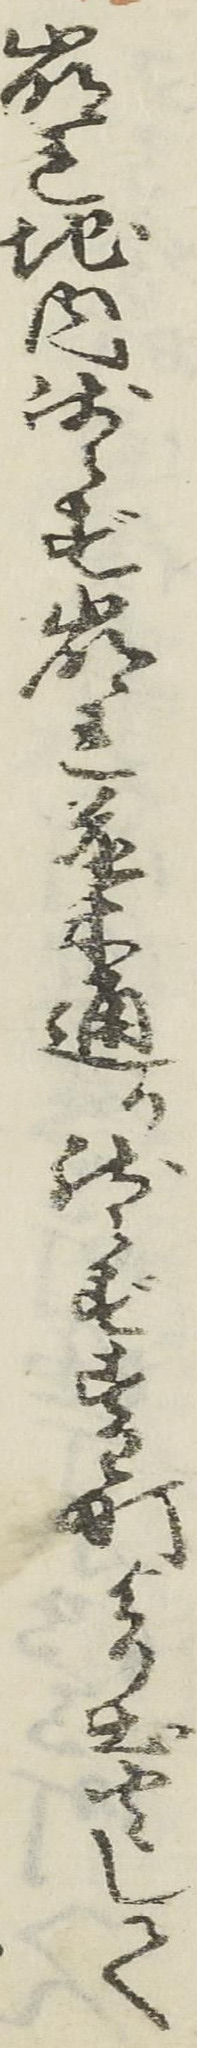神風神崩れ地内残らず崩れ蓬莱通り残らずすわ町より出火して
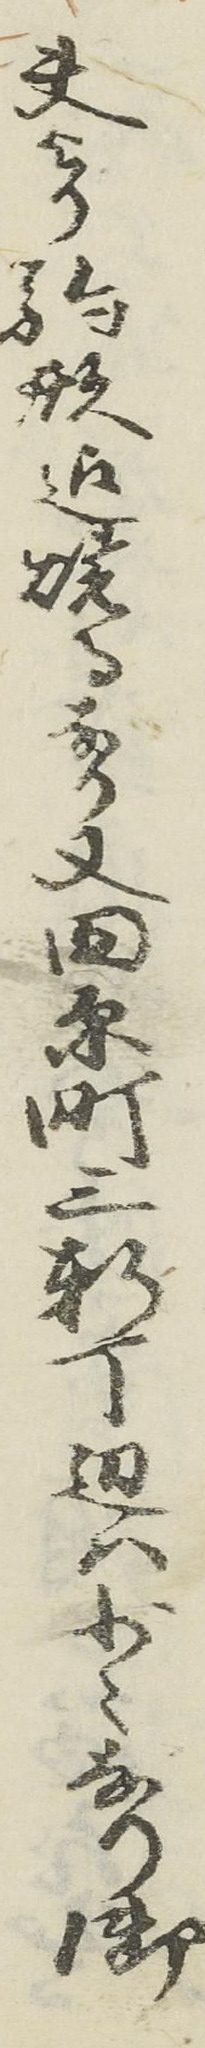計崩し夫より駒形迄焼るなり又田原町三軒丁辺は少〻なり御

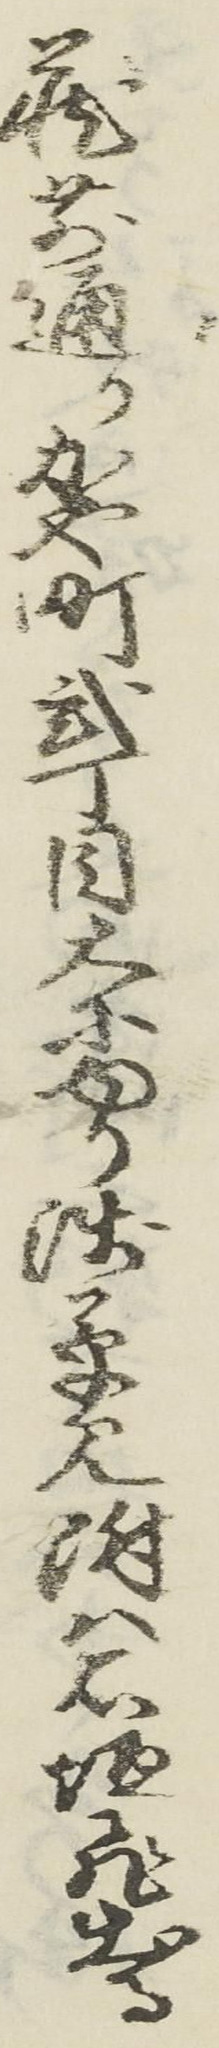蔵前通りかや町弐丁目大にゆり浅草見付は石垣飛出る
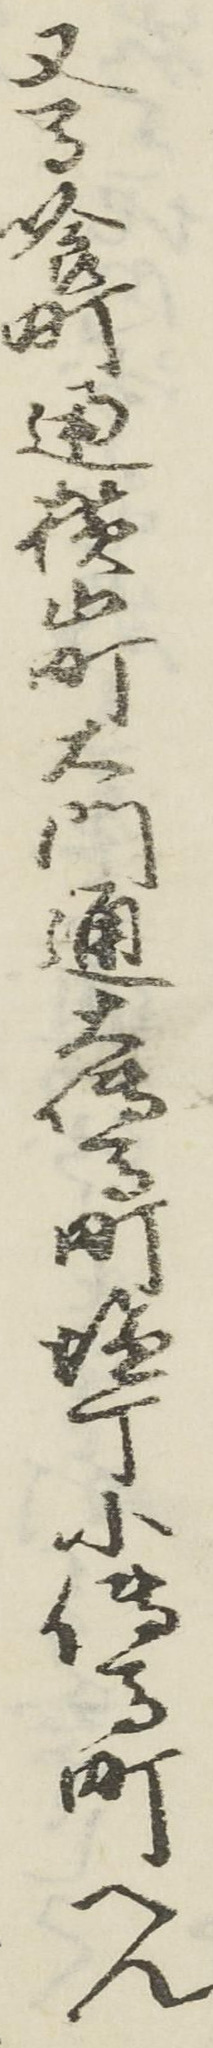又馬喰町通横山町大門通大伝馬町塩丁小伝馬町へん
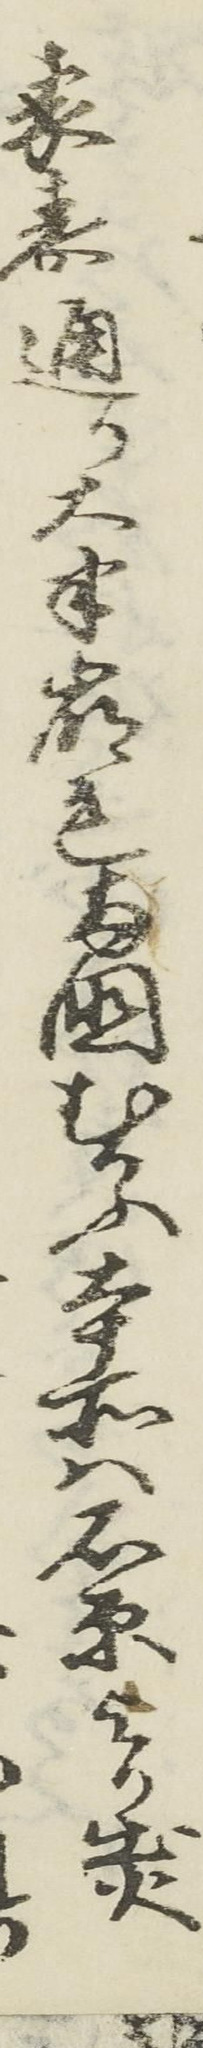裏表通り大半崩れ両国むかふ本所は石原より出火
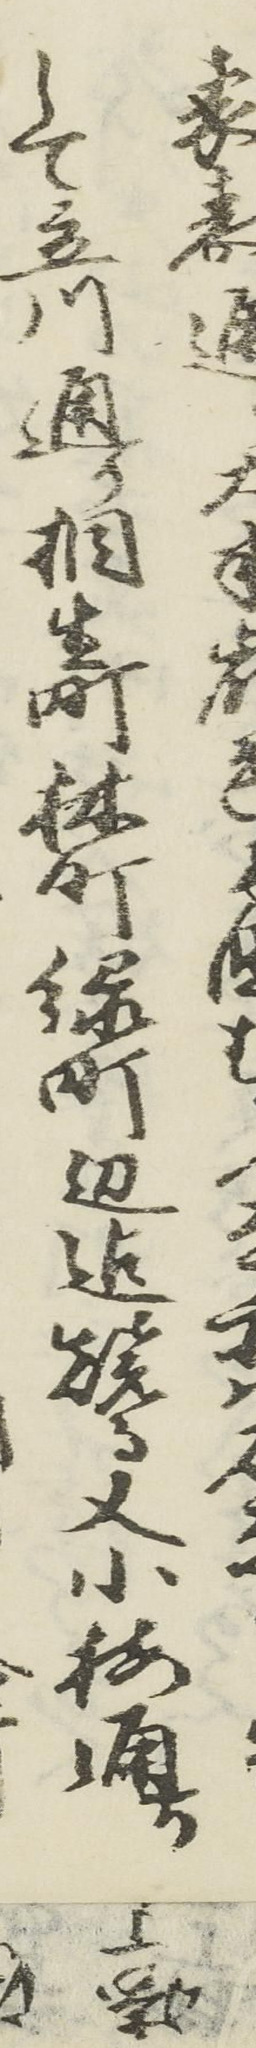して立川通り相生町林町緑町辺迄焼る又小梅通り
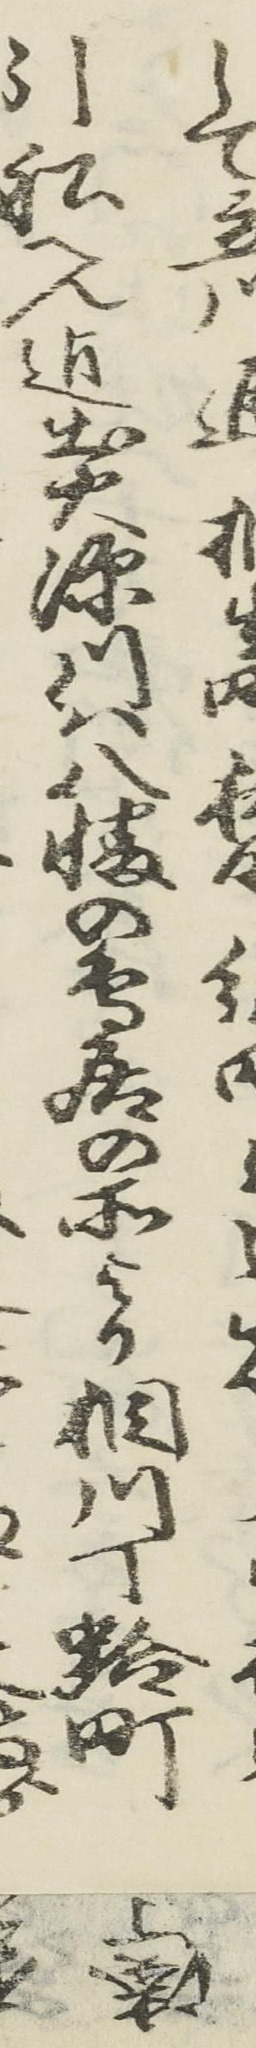引舩へん迄出火深川は八幡の鳥居の所より相川町蛤町
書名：安政乙卯江戸大地震筆記　安政丙辰八月大阪大雷雨之記追加　安政三辰年七月松前辺大地震并八月大風雨記録
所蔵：東京大学地震研究所図書室 Earthquake Research Institute Library, The University of Tokyo, JAPAN
